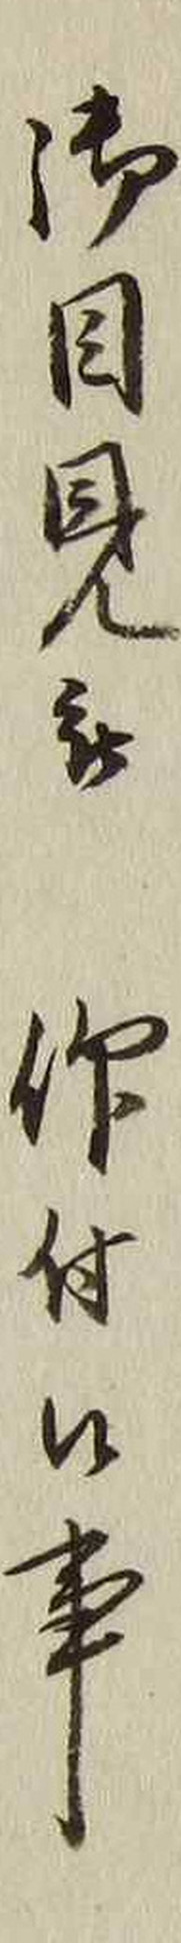御目見被仰付候事
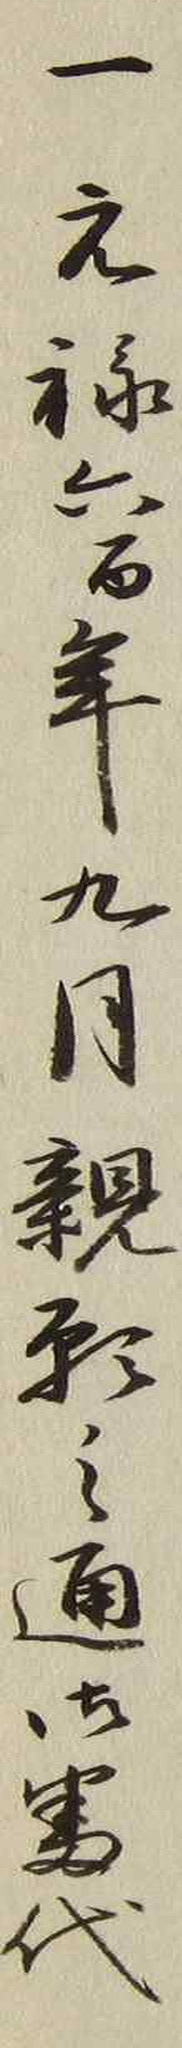一元禄六酉年九月親願之通御番代
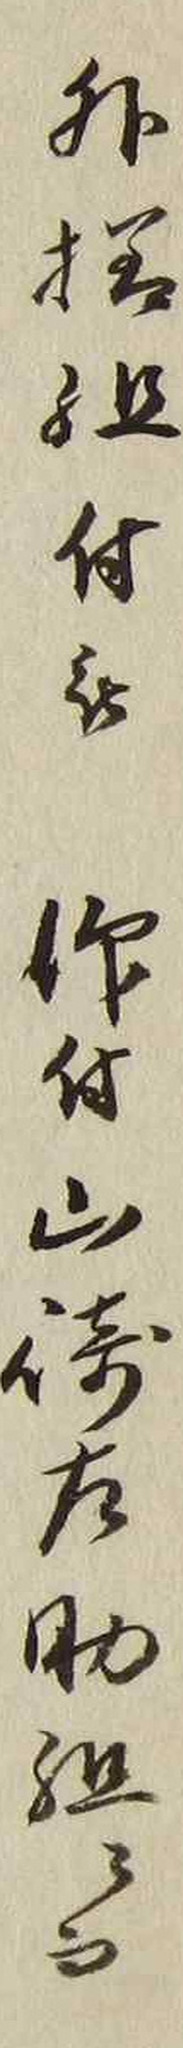外様組付被仰付山崎左助組ニ而
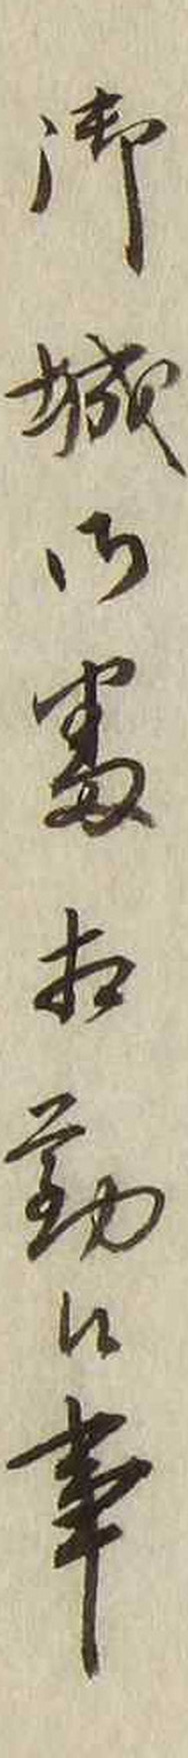御城御番相勤候事

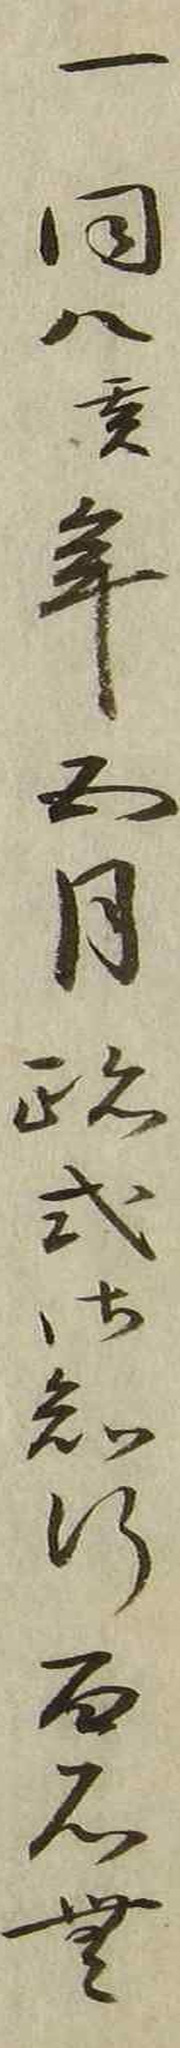一同八亥年五月跡式御知行百石無
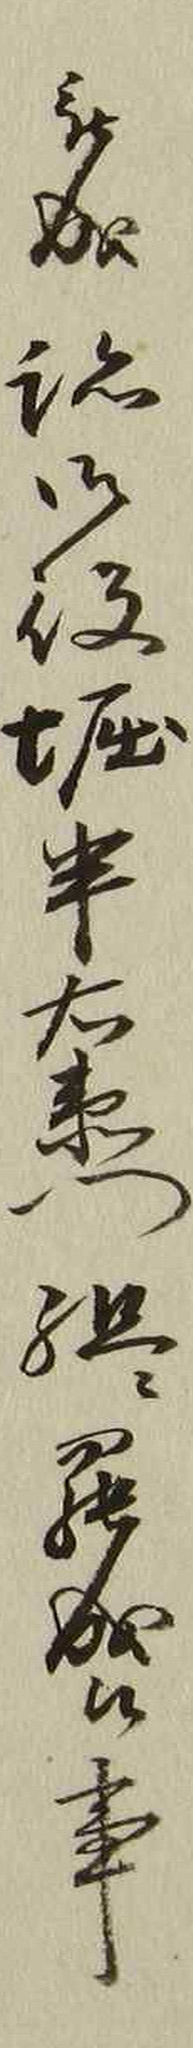被成跡御役堀半右衛門組二罷成候事
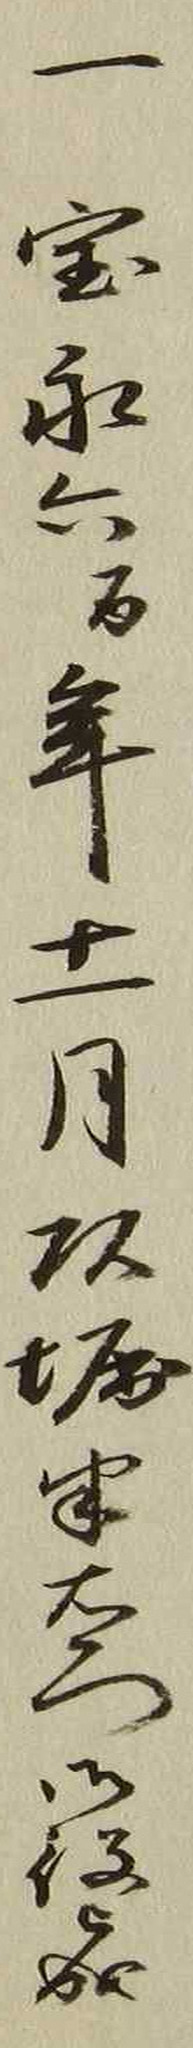一宝永六酉年十一月頭堀半右衛門御役被成
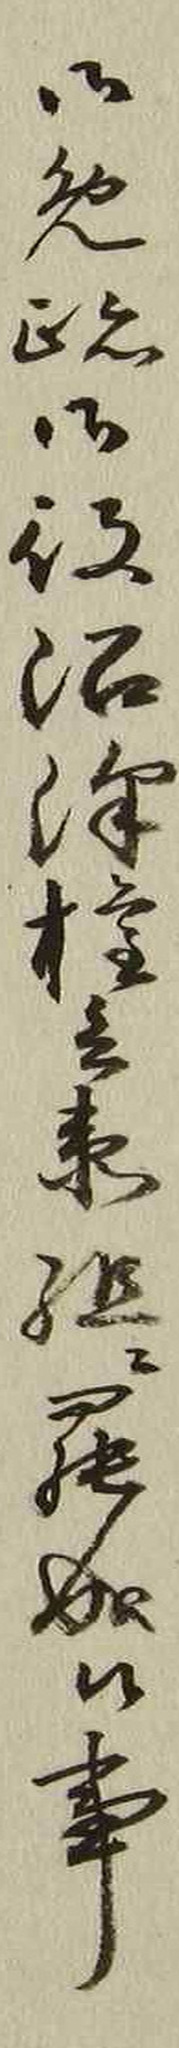御免跡御役沼澤権兵衛組二罷成候事
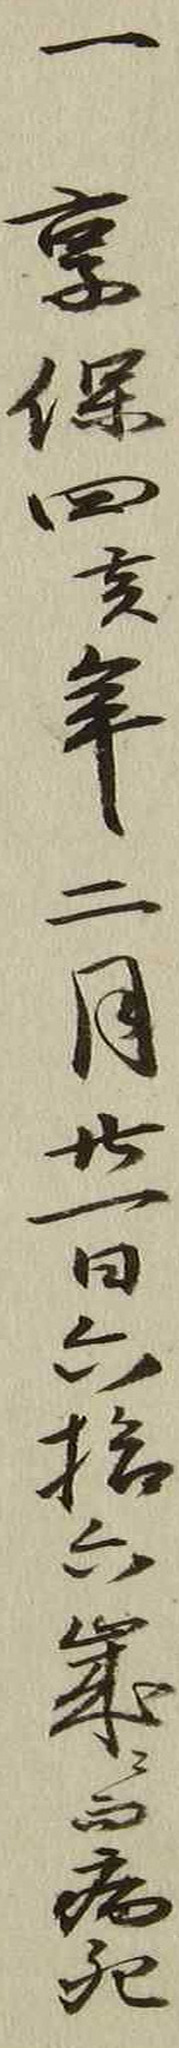一享保四亥年二月廿一日六拾六歳二而病死
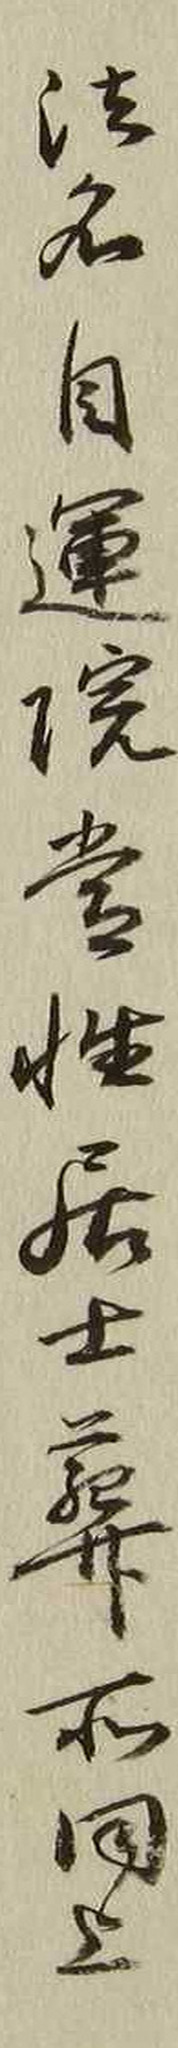法名自運院常性居士葬所同上
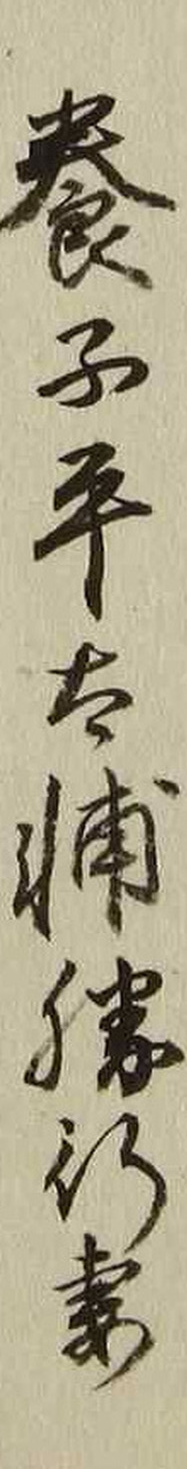女養子平太輔勝行妻
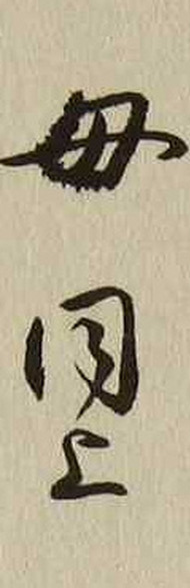母同上
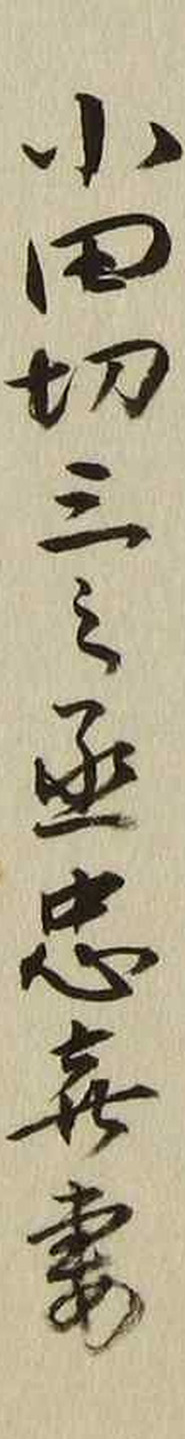小田切三之丞忠喜妻
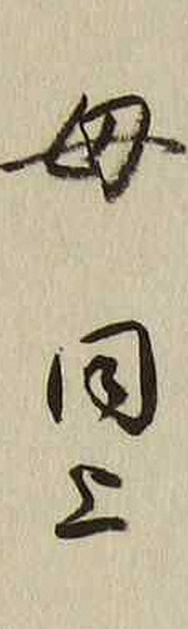母同上
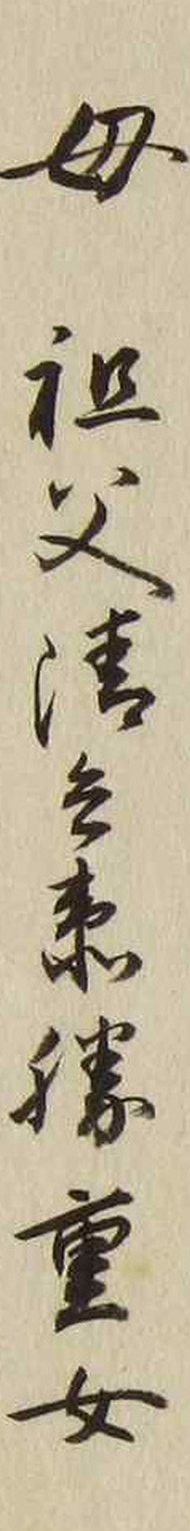母祖父清兵衛勝重女

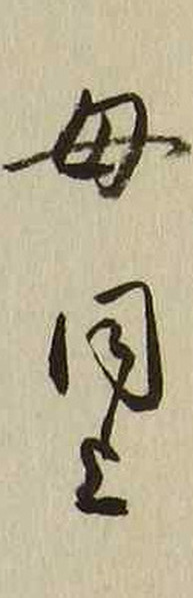母同上
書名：諸士系譜　巻之128　た之部4
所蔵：会津若松市立会津図書館
